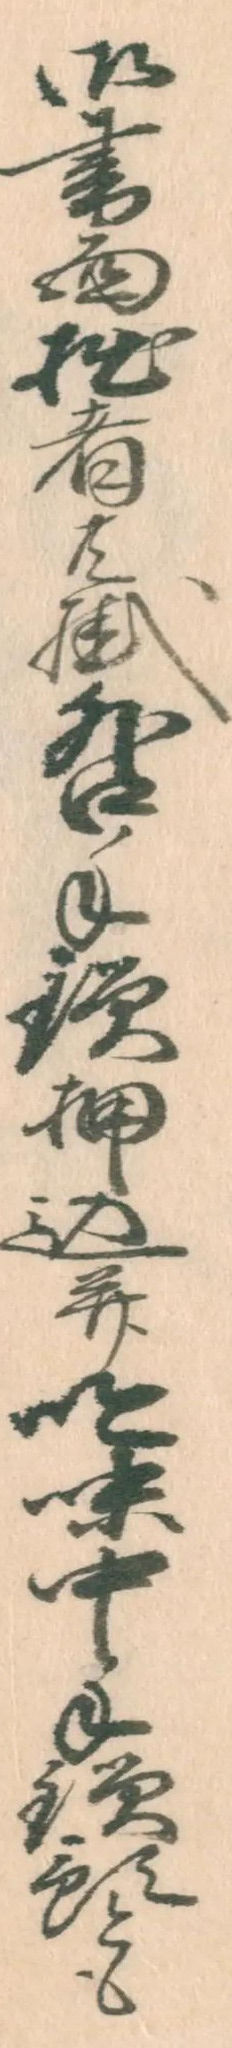御書面拙者共掛咎手鎖押込幷吟味中手鎖預とも
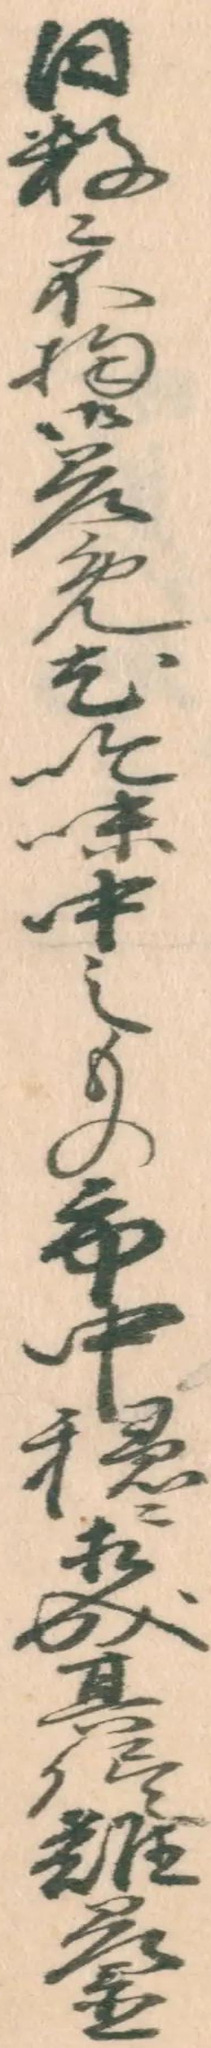日数ニ不拘御差免尤吟味中之もの市中穏ニ相成其儘難捨置
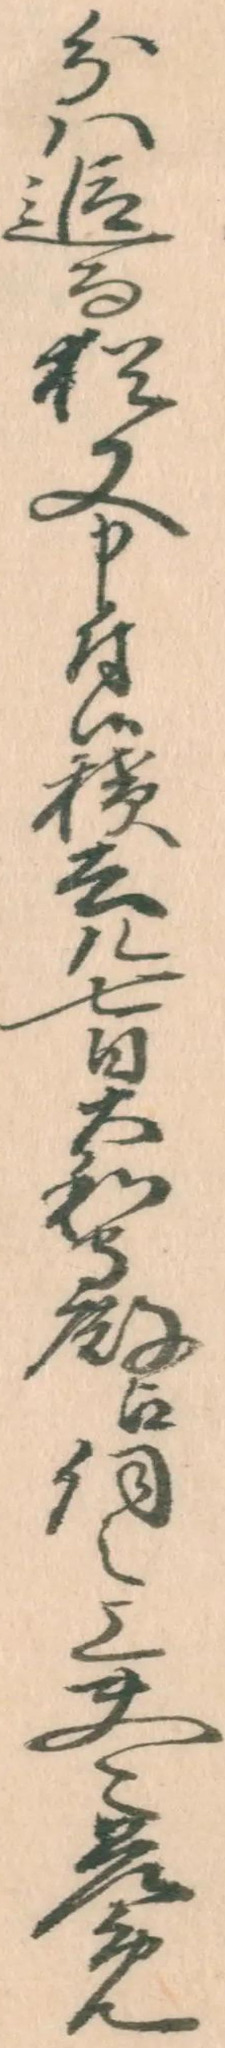分ハ追て猶又申付候積去ル七日大和守殿え伺之上夫〻差免
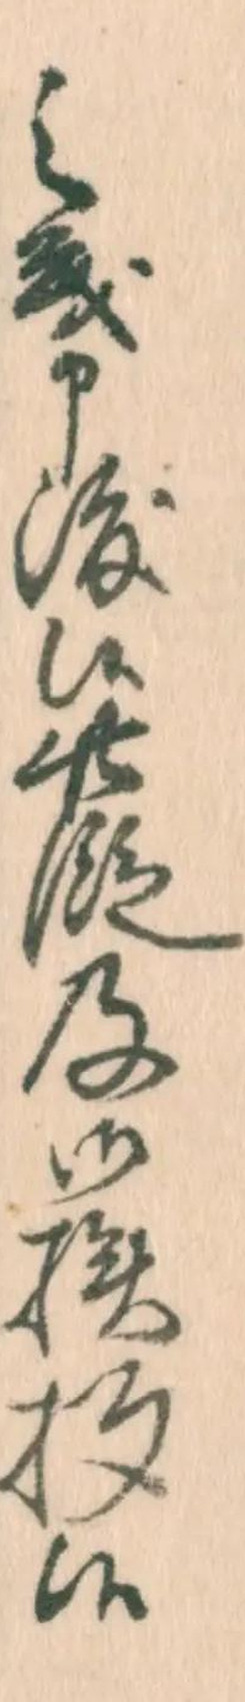之義申渡候此段及御挨拶候
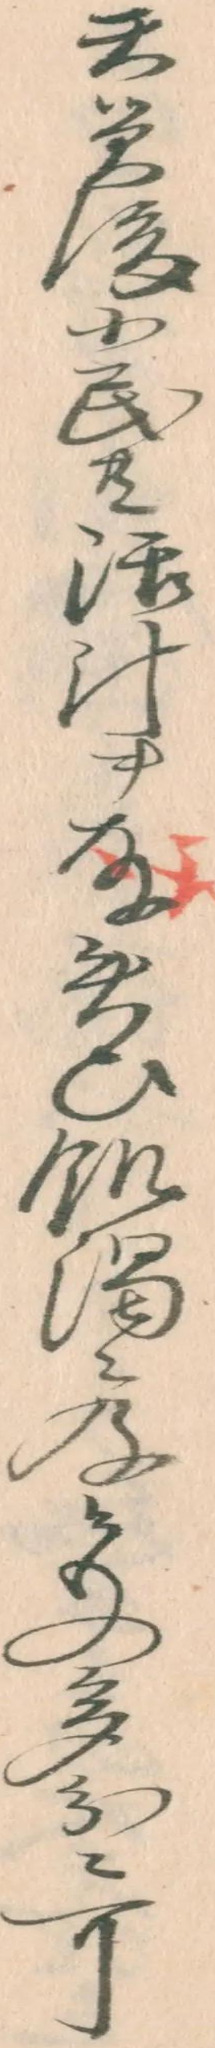天災後小民共活計ヲ取失ひ飢渇ニ及候もの多分ニ可
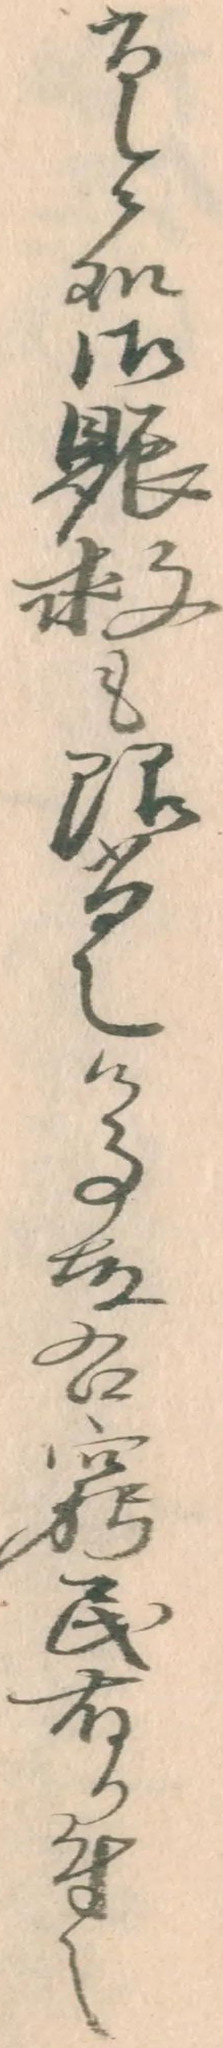有之候処御賑救も限有之候事故右窮民有り付之
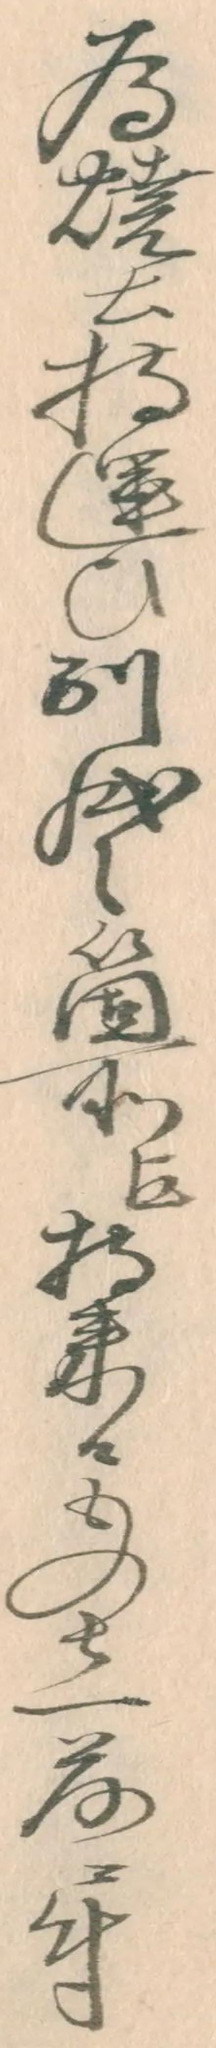為焼土持運ひ別紙之箇所え持参候ものは一荷ニ付

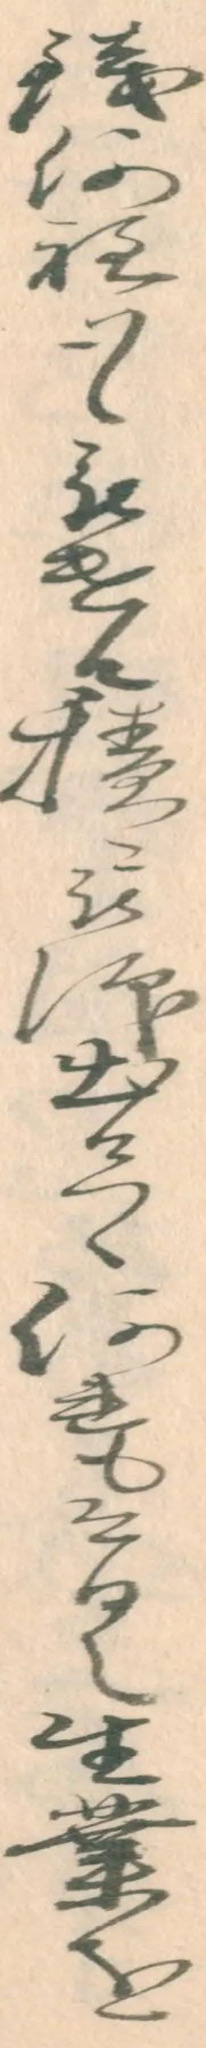銭何程ツヽ被遣候積ニ被仰出候ハヽ何れも右之生業を
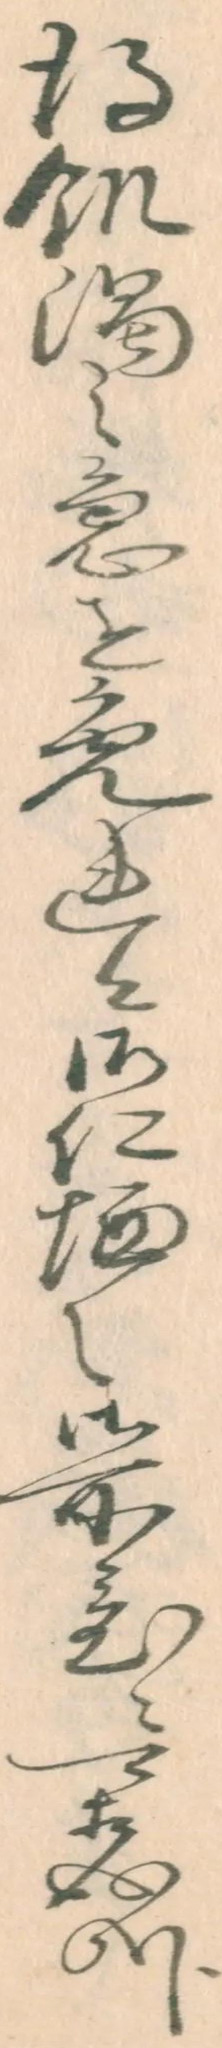得飢渇之急を免れて御仁恤之御所置ニ可相成成哉ト
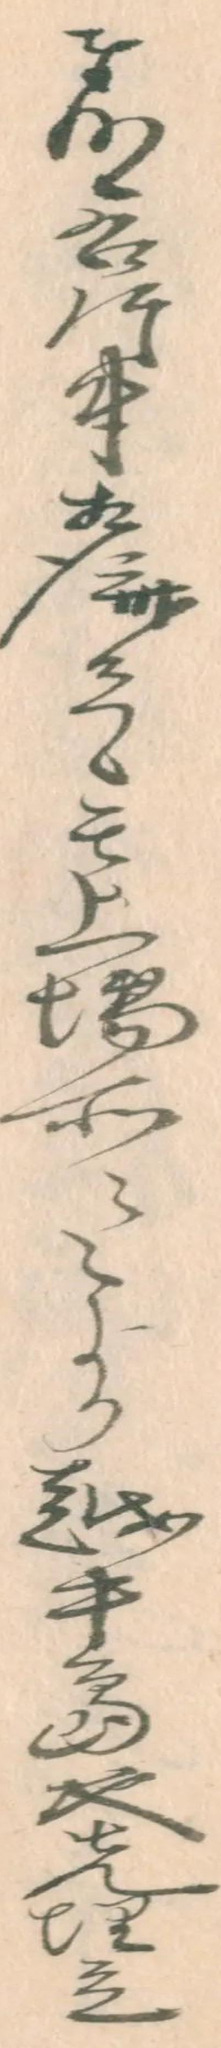奉存候右片付相済候ハヽ其上場所〻ニより越中島地先埋立
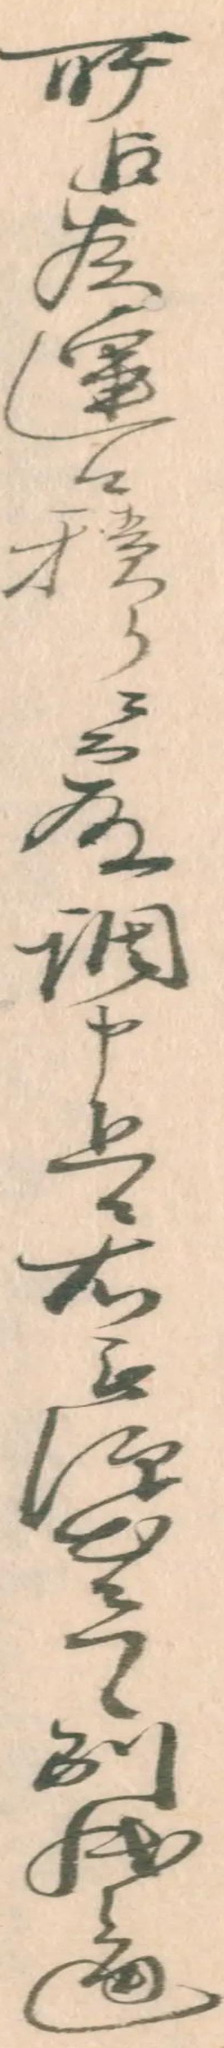所迄為運候積りニて取調申上候右被仰出候ハヽ別紙之通
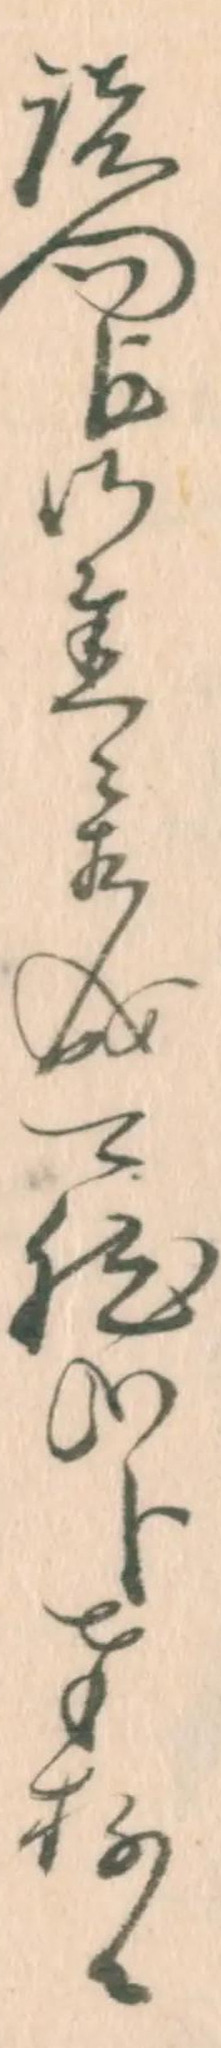諸向え御達ニ相成可然哉ト奉存候
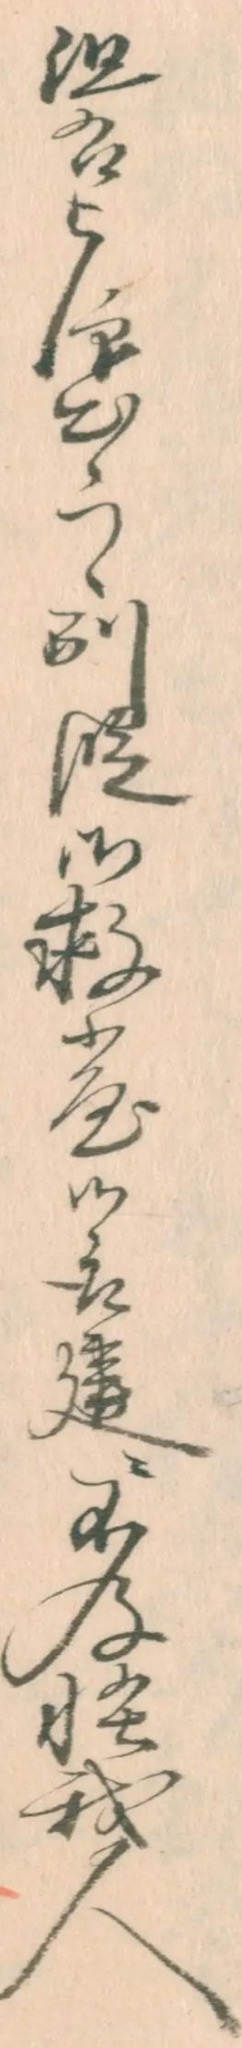但右被仰出候ハヽ別段御救小屋御取建ニ不及怪我人
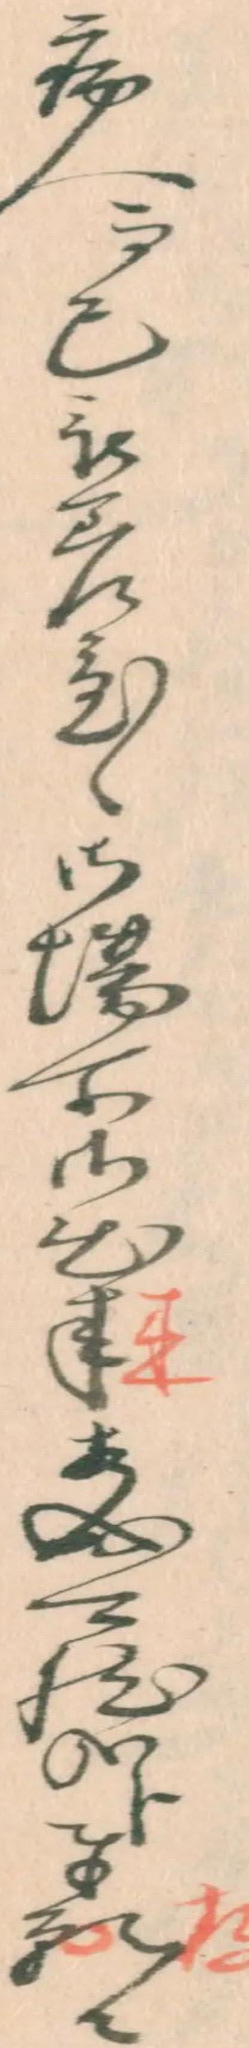病人而已被差置候御場所御出来相成可然哉ト奉存候
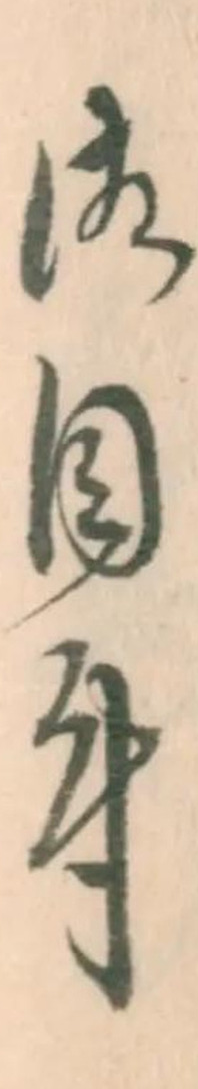御目付
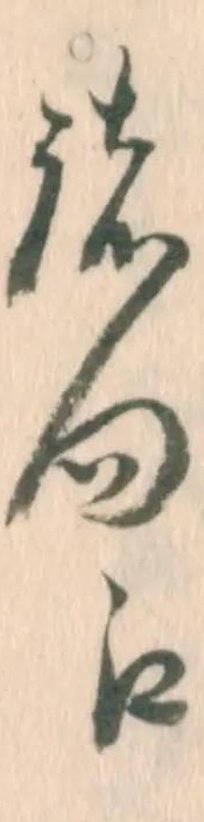諸向え
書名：地震災書留 2巻. [2] 内表紙に「地震一件　安政二卯年十月」とあり
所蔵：国立国会図書館 National Diet Library, JAPAN
